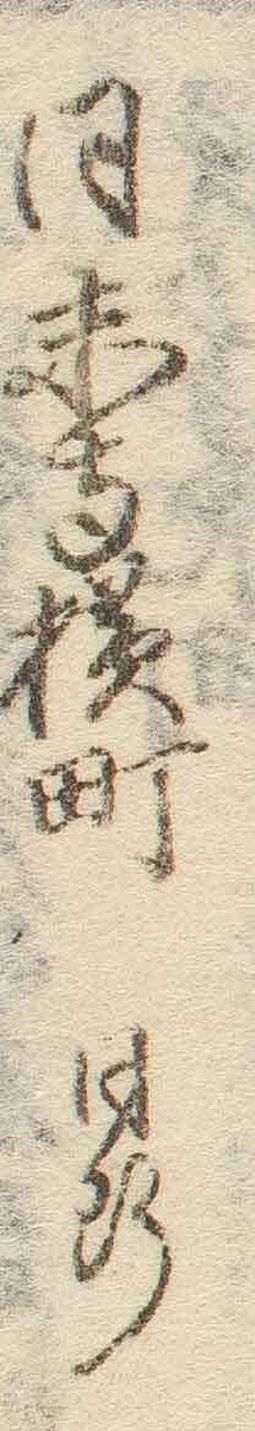同末寺横町同断
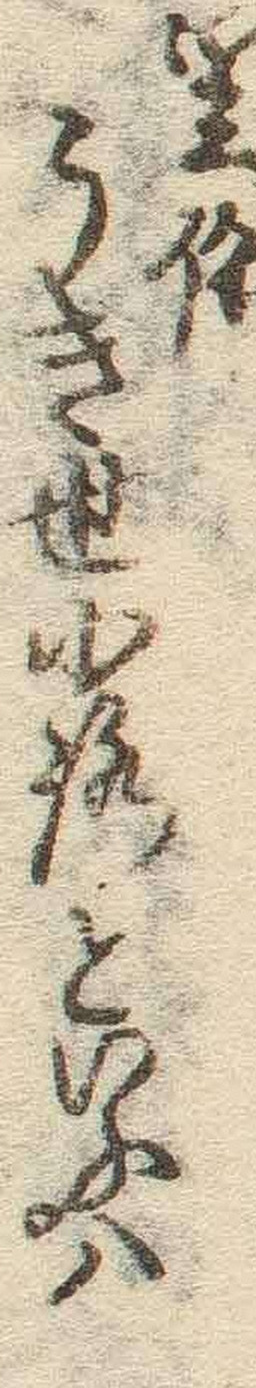うき世小路といふは
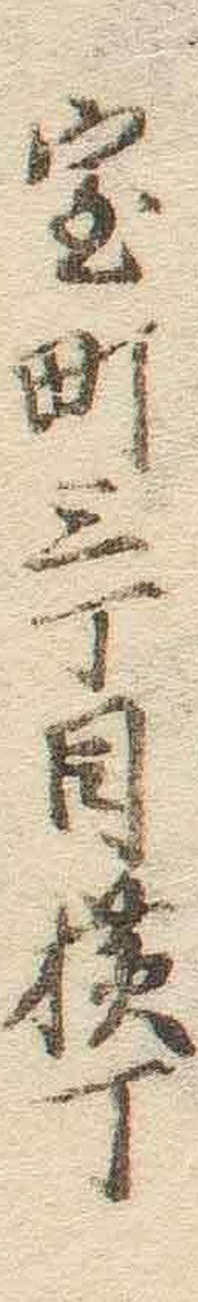○室町三丁目横丁
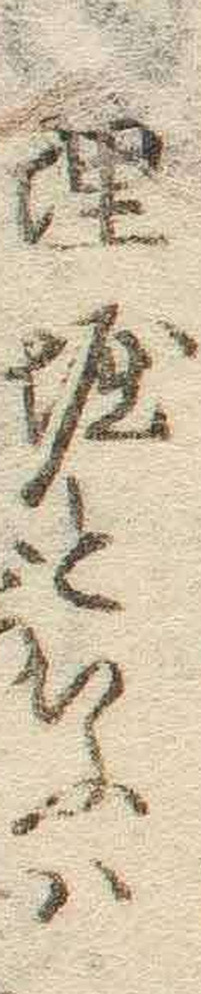埋堀といふは
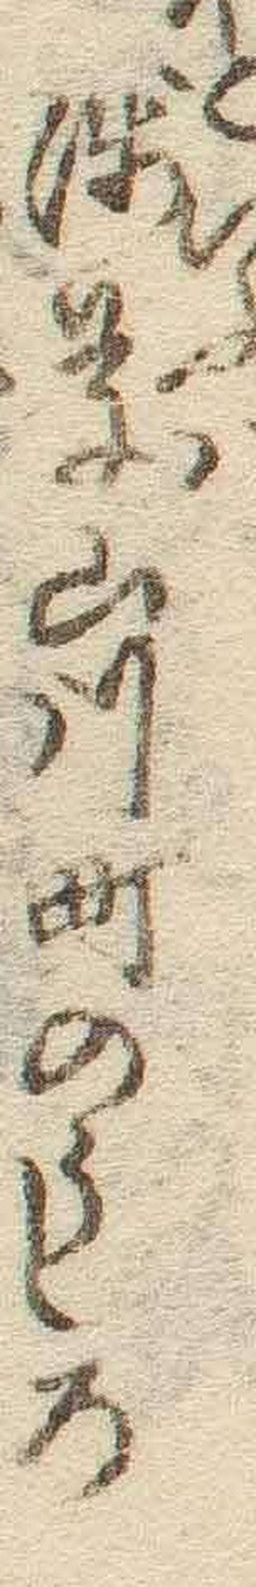浅草山川町のうしろ
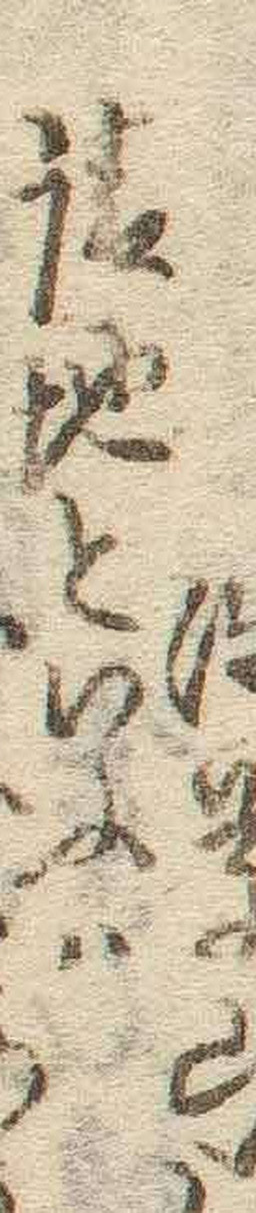請地といふは
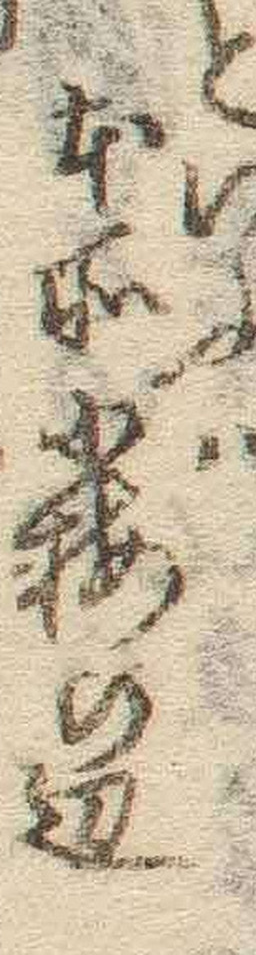本所小梅の辺
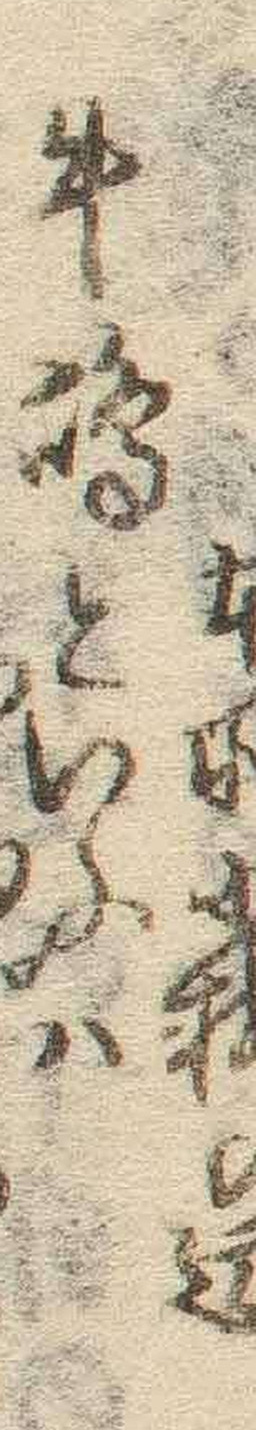牛島といふは
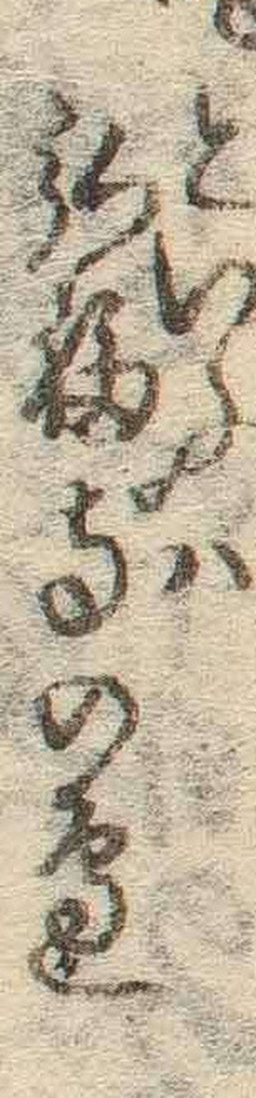弘福寺の辺

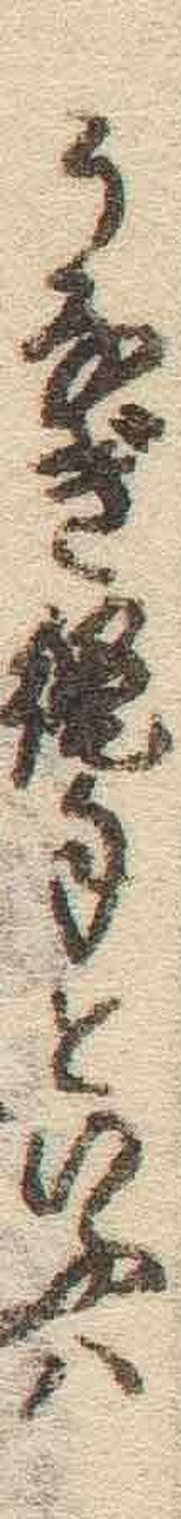うなぎ縄手といふは
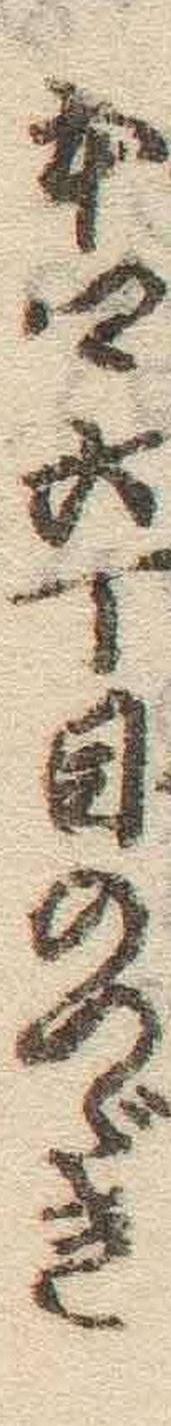本郷六丁目のつゞき
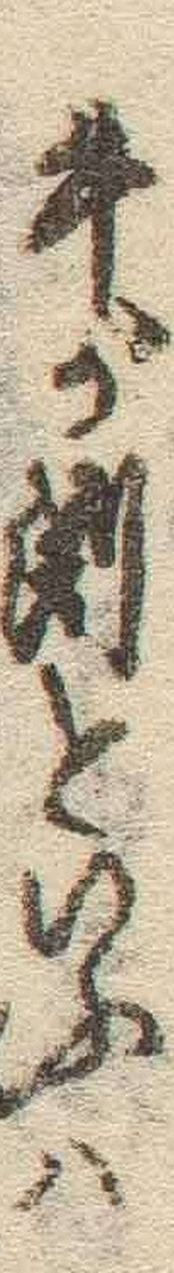牛が渕といふは
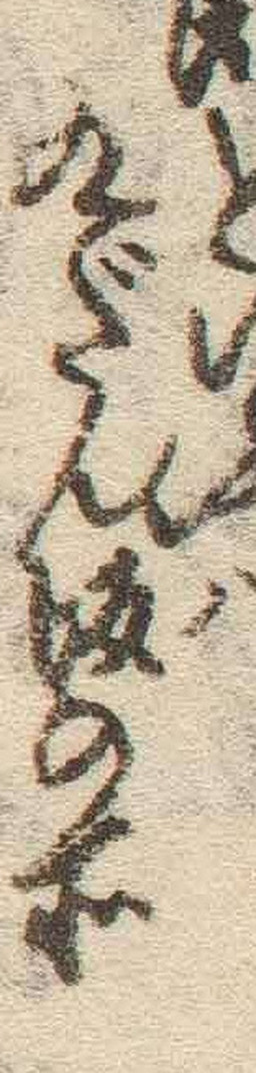九だん坂の所
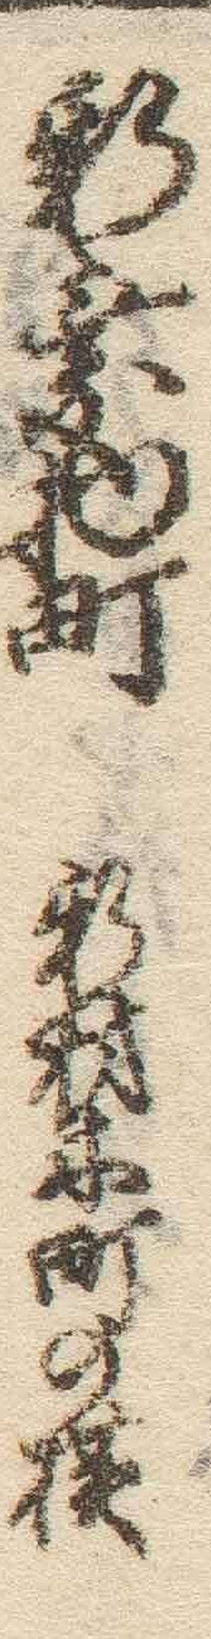新乗物町新材木町の横
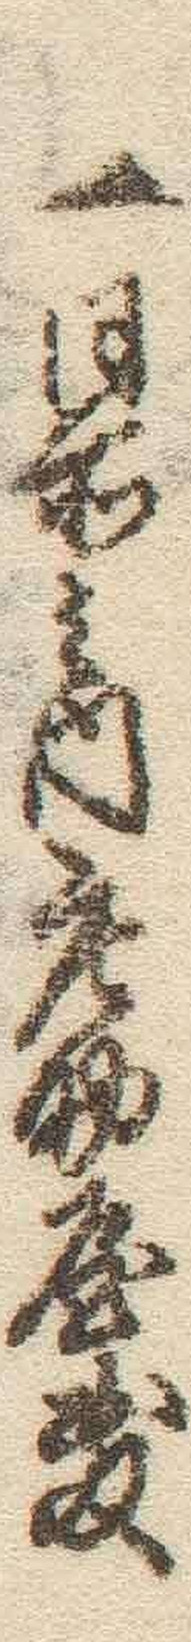▲同所之内庄助屋敷
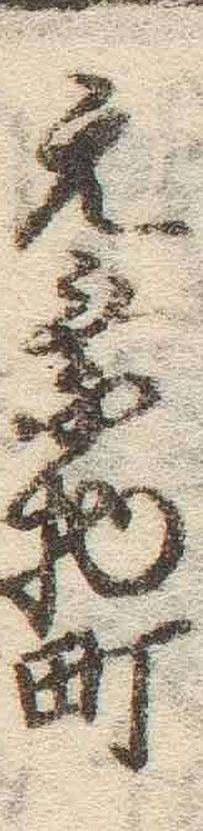元乗物町
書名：江戸町独案内
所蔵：東京学芸大学附属図書館 国文学研究資料館
